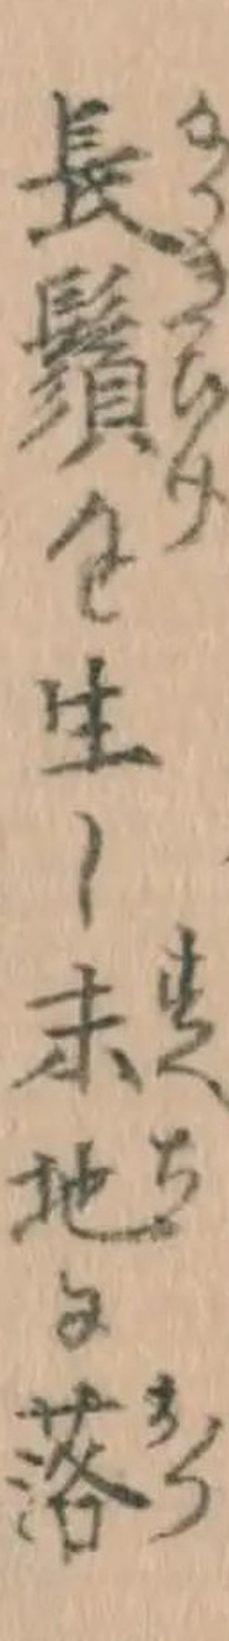長鬚を生し末地に落
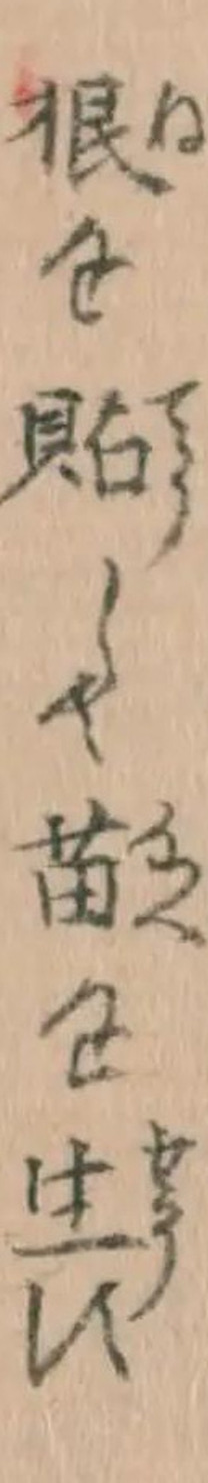根を貼して苗を生す

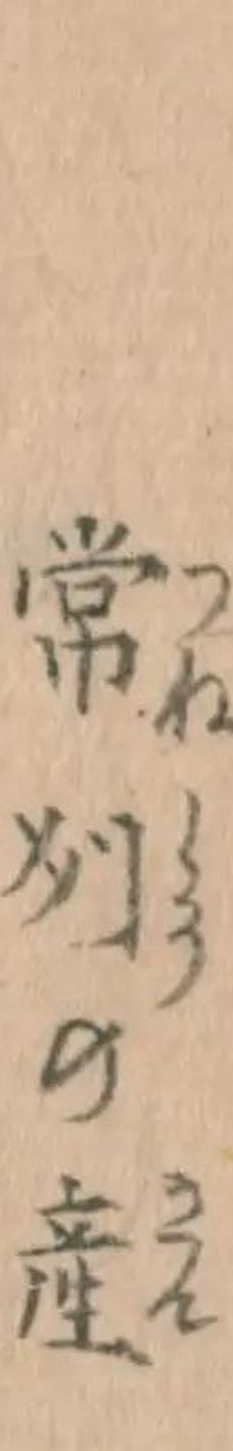常州の産
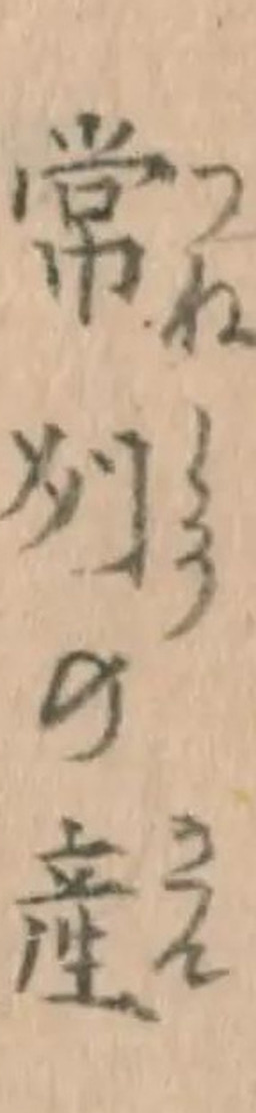常州の産
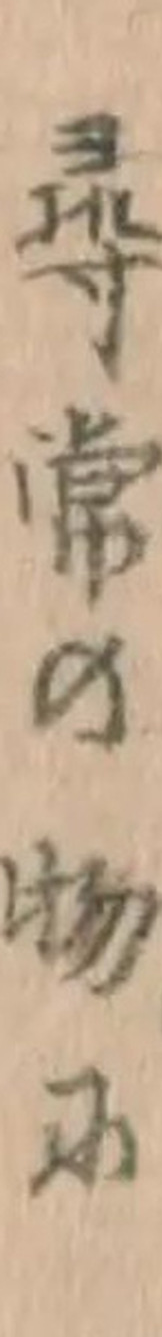尋常の物に
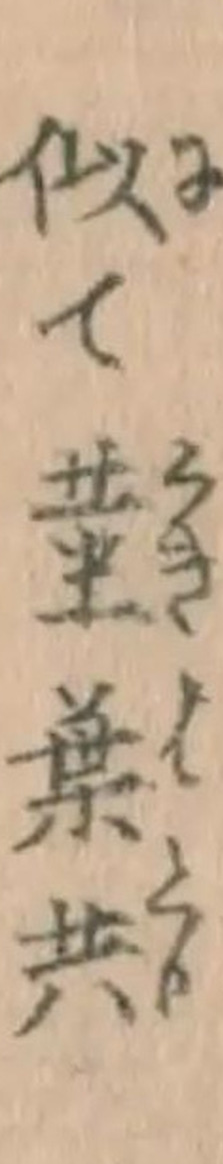似て茎葉共
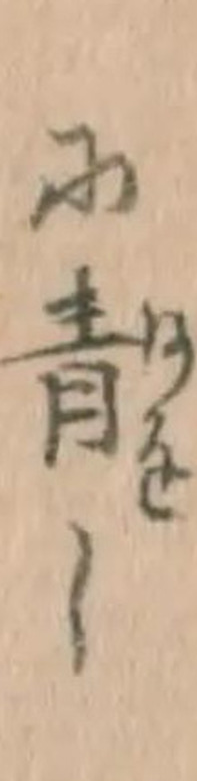に青し
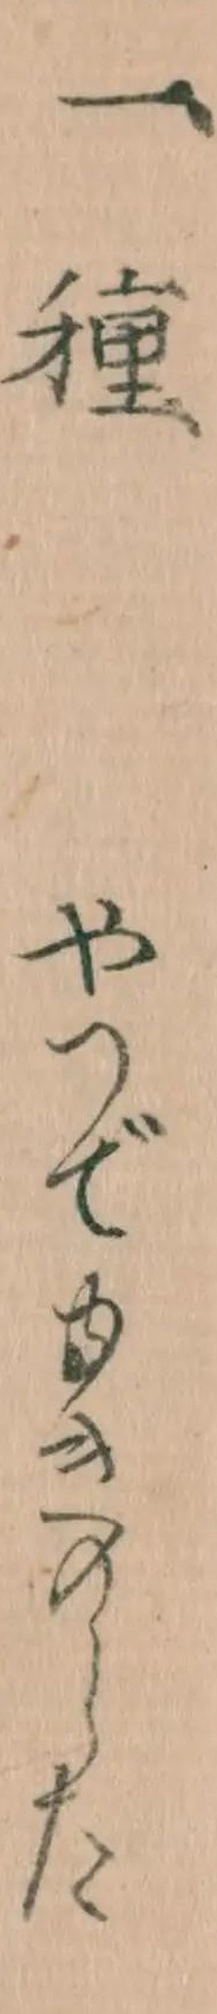一種やつでゆきのした
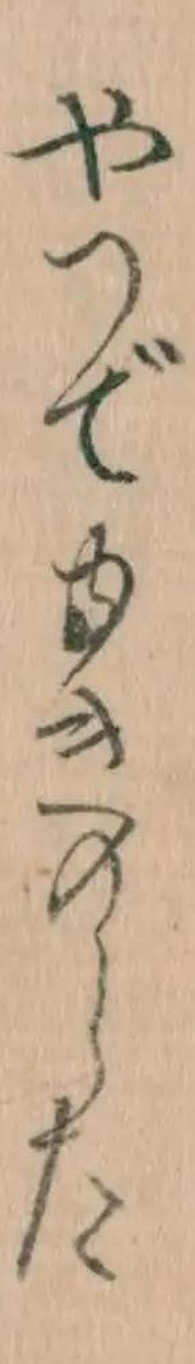やつてゆきのした
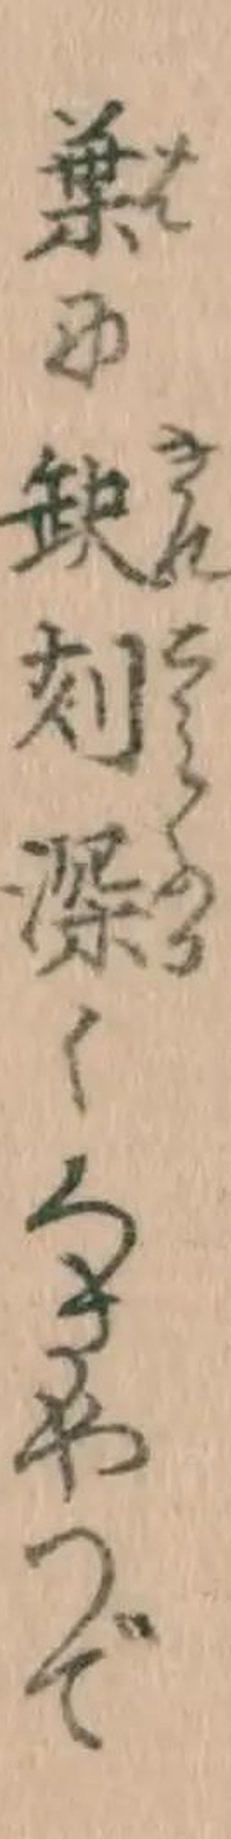葉に欠刻深くくさやつで
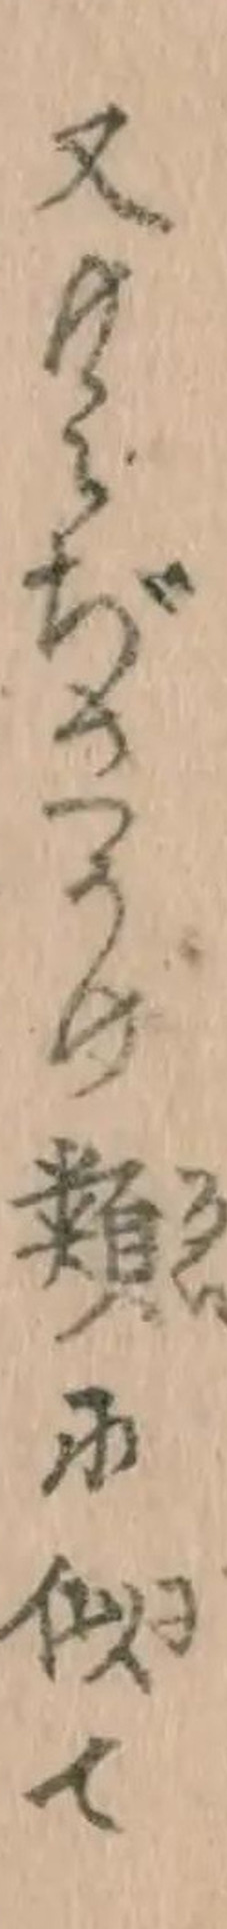又もみぢさうの類に似て
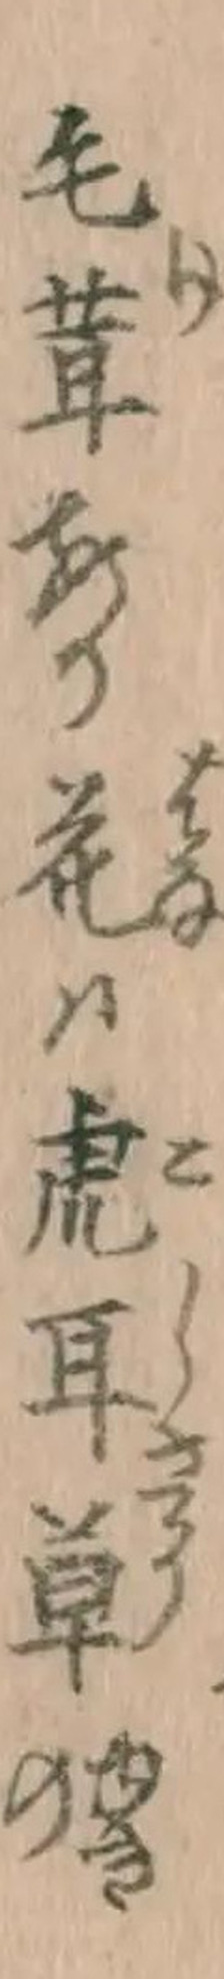毛茸あり花は虎耳草ゆきの

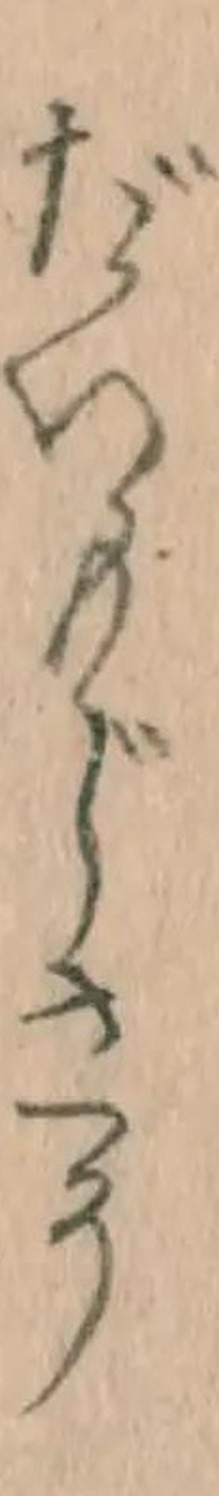だいもじさう
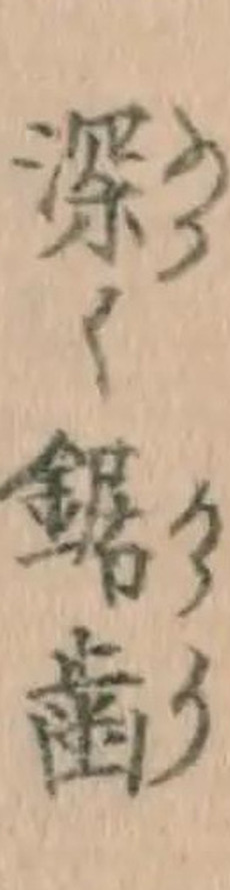深く鋸歯
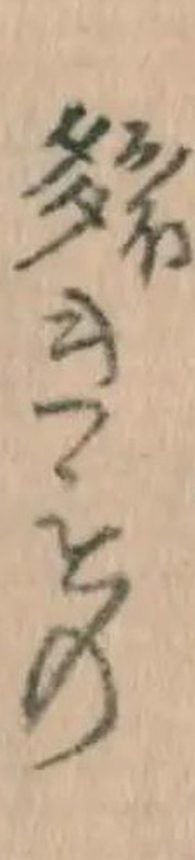多きもの
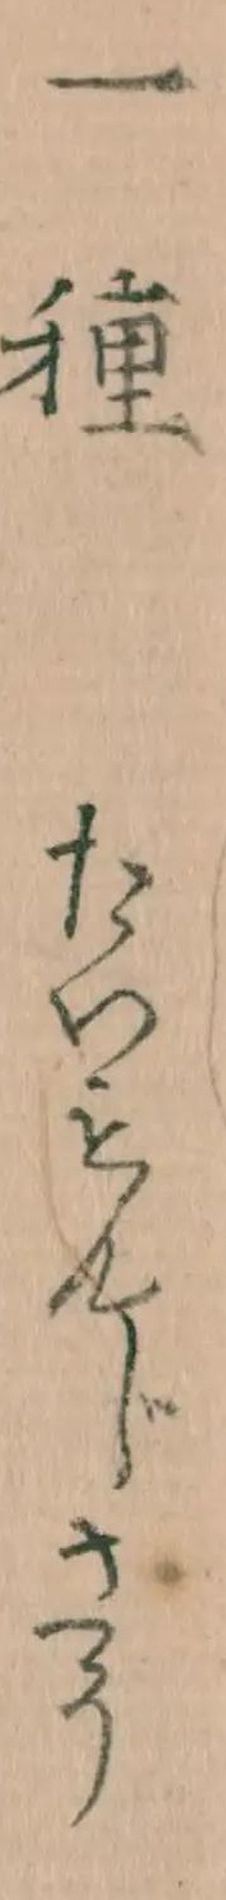一種たいもんじさう
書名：本草図譜. 巻34-36
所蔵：国立国会図書館 National Diet Library, JAPAN
